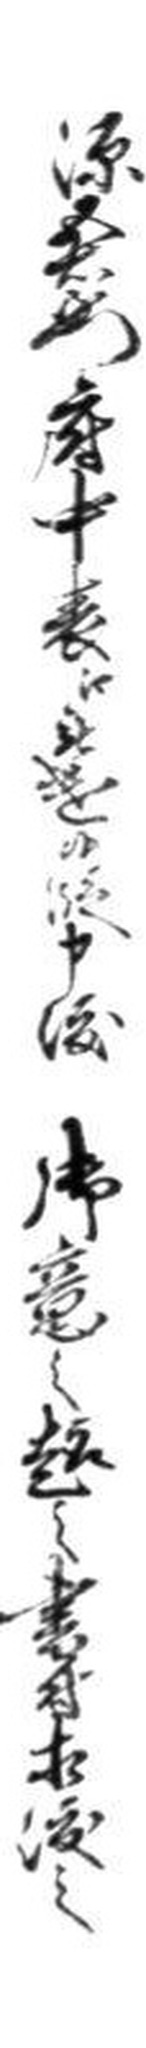源五右衛門府中表江被遣候段申渡御意之趣之書付相渡之
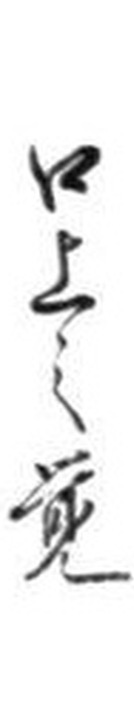口上之覚
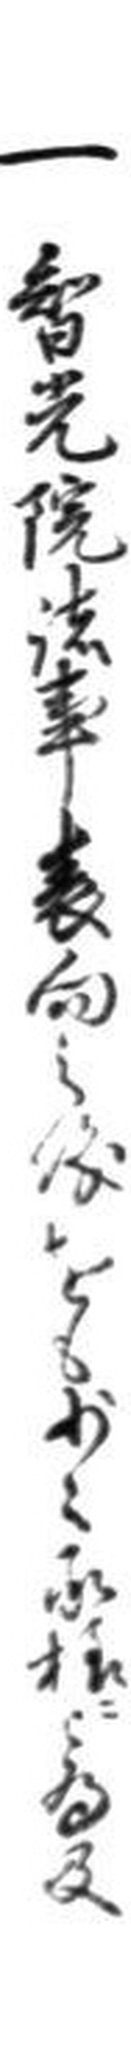一智光院諸事表向之儀をも少々承様ニ被為及
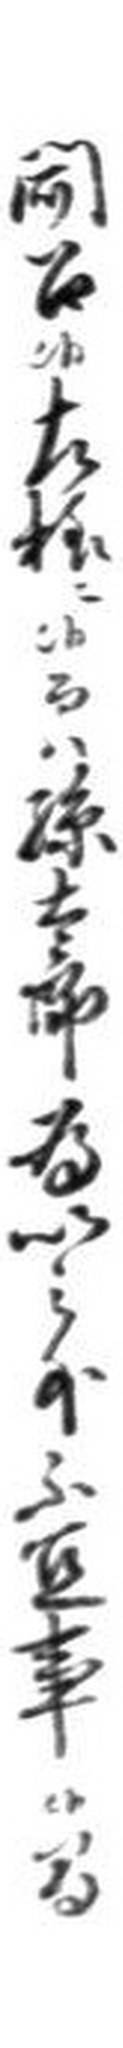聞召候左様ニ候而ハ孫太郎為以之外不宜事候間
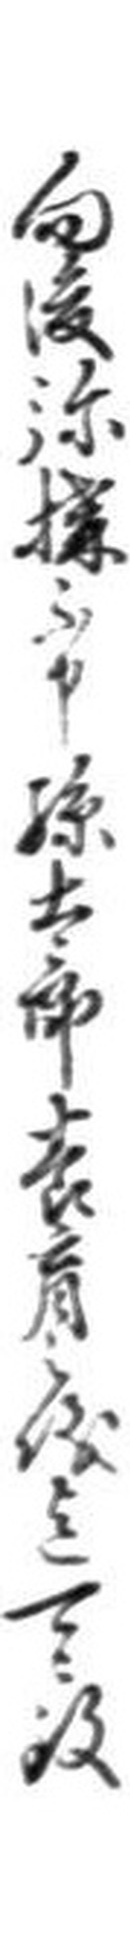向後弥構不申孫太郎養育之儀迄可被致
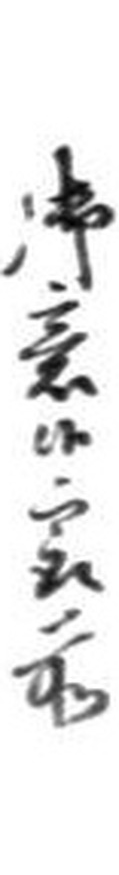御意候最前
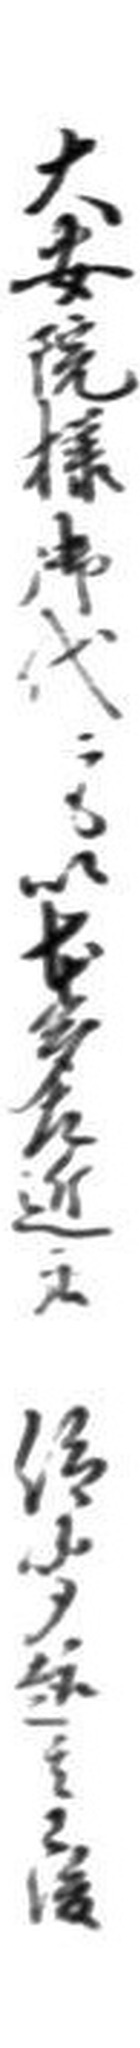大安院様御代ニも以て本多左近被仰聞趣其己後
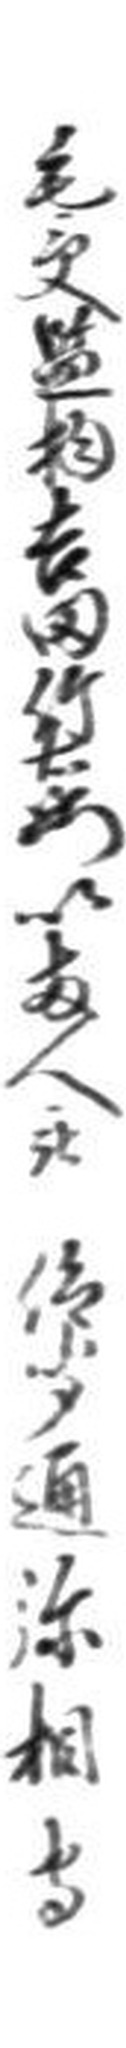毛受監物吉田竹右衛門以両人被仰聞通弥相
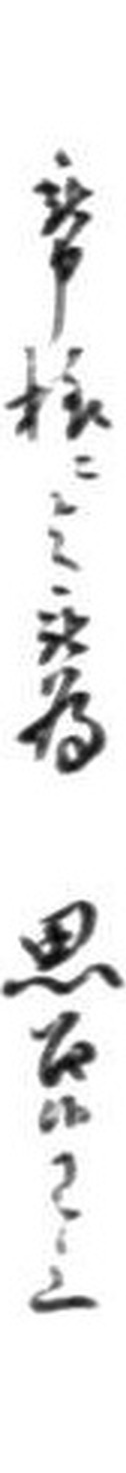被申様ニと被為思召候己上
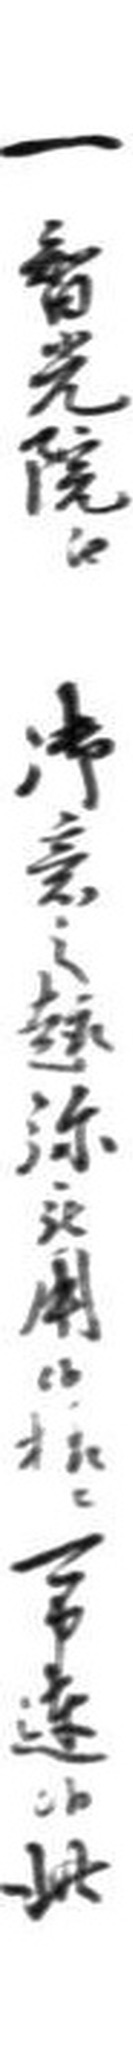一智光院江御意之趣弥被用候様ニ可申達候此

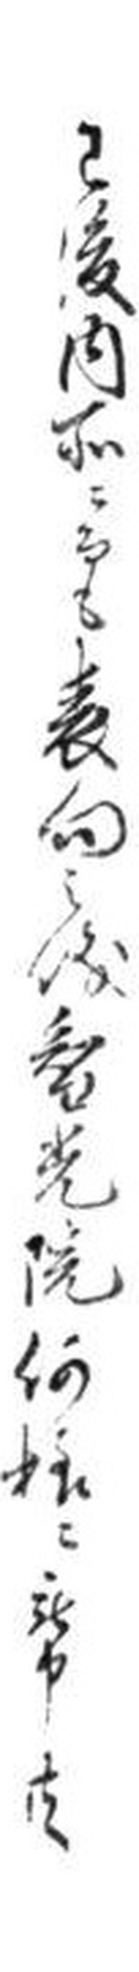已後内所ニ而も表向之儀智光院何様ニ被申共
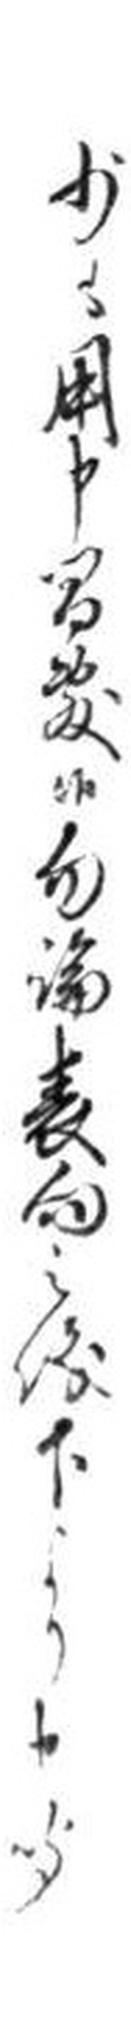少も用申間敷候も勿論表向之儀下より申聞
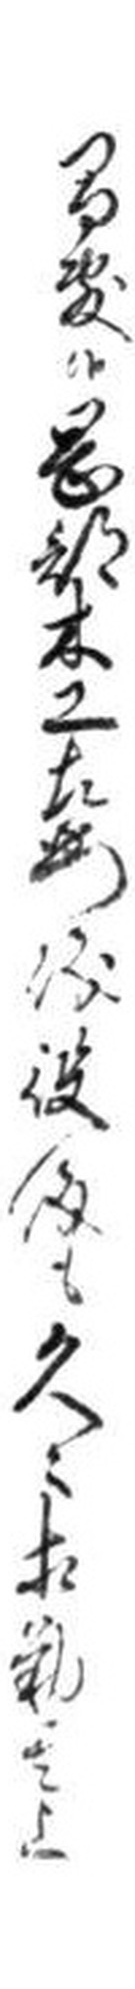間敷候岡部木工左衛門儀役儀も久々相勤其上
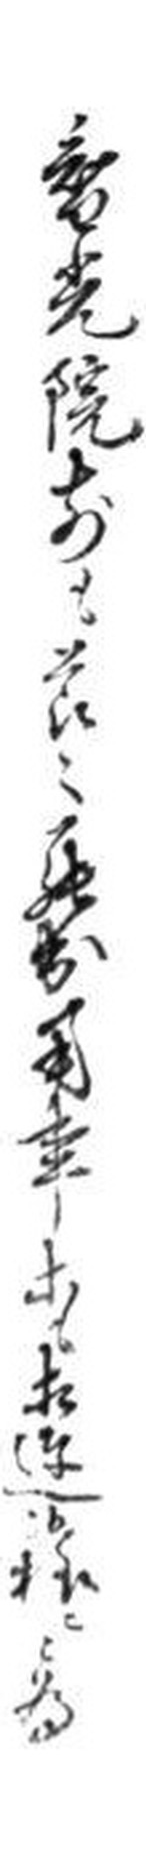智光院前も節々罷出用事等も相達候様ニ被為
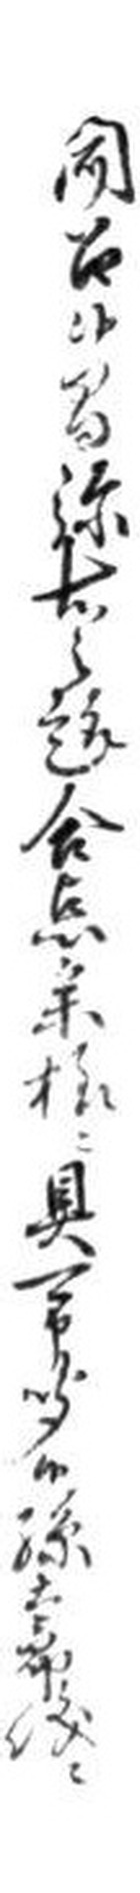聞召候間弥右之趣合点参様ニ具可申聞候孫太郎儀ニ
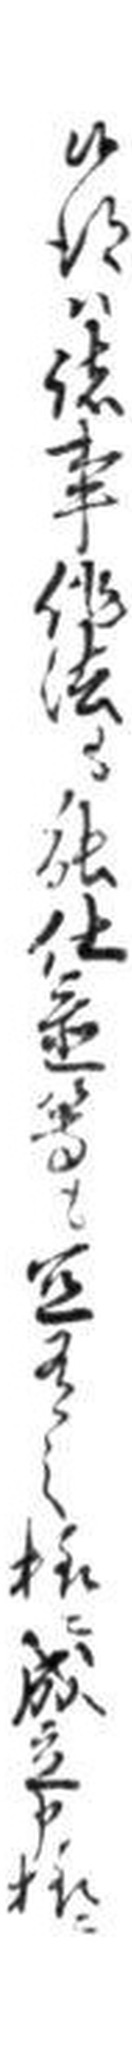候得ハ諸事作法も能仕置等宜有之様ニ成立申様ニ
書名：家譜 十五 綱昌公 従天和元年到元禄十二年
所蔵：福井県文書館 Fukui Prefectural Archives
